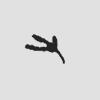又
